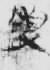受
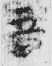○（期）
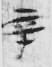辛
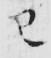巳
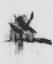之
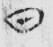日
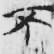不
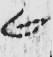㠯（以）
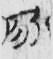所
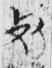死
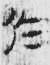於
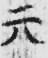亓（其）
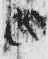州
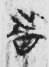者
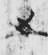之
